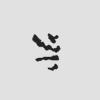星
